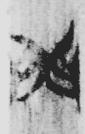門
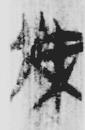傑（桀）
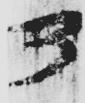乃
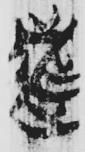逃
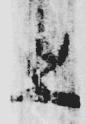之
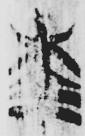南
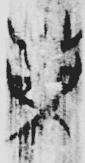○（巢）
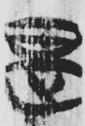是（氏）
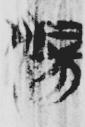湯
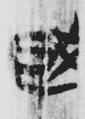或（又）
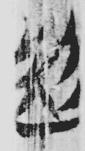從
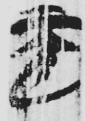而
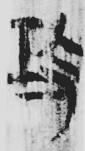攻
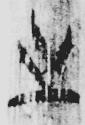之
